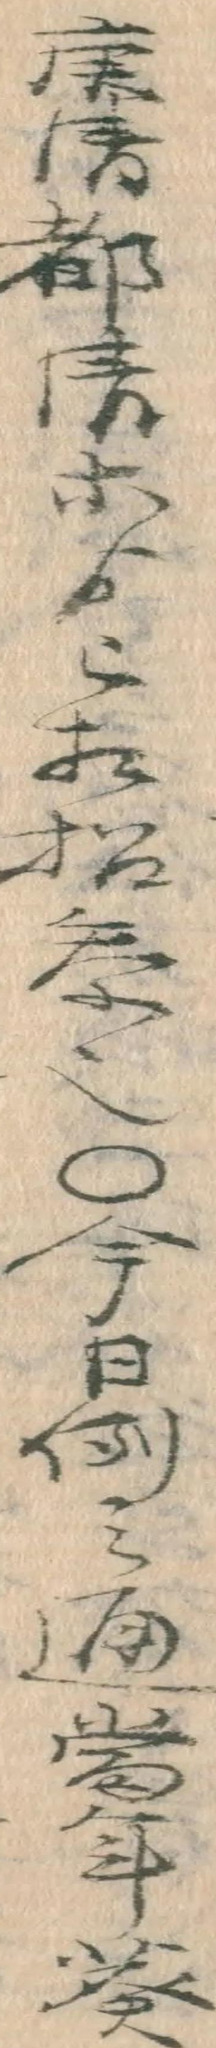庚清都清等ゟ被相招参也○今日例之通当年葵
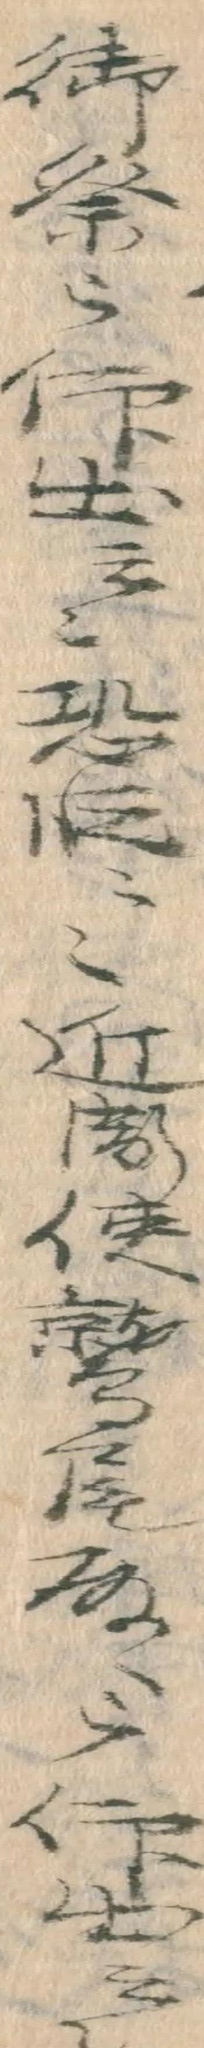御祭被仰出云々恐悦〻〻近衛使鷲尾殿へ被仰出云々
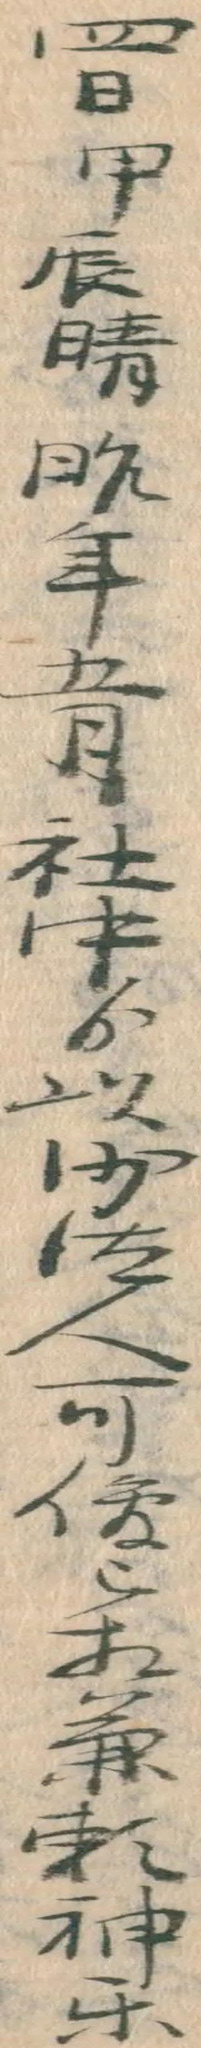四日甲辰晴昨年五月社中ゟ以沙汰人可俊被相兼頼神楽
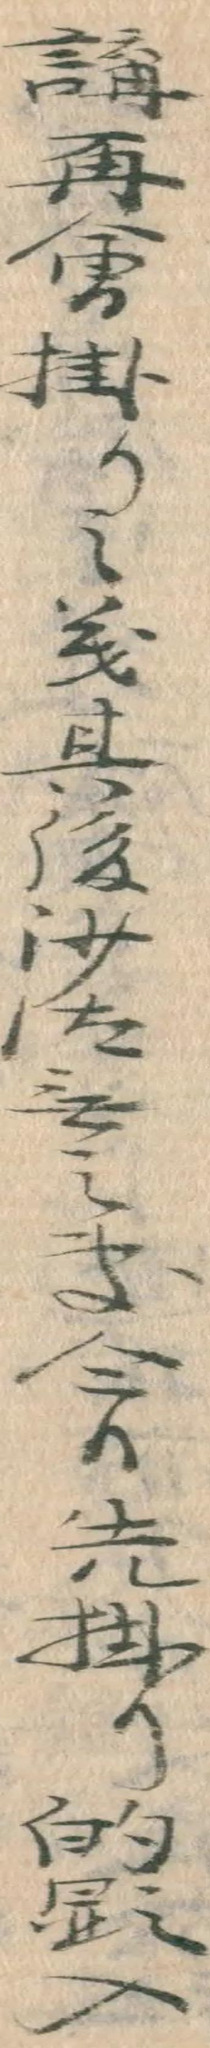講再会掛り之義其後沙汰無之処今日先掛り的顕入
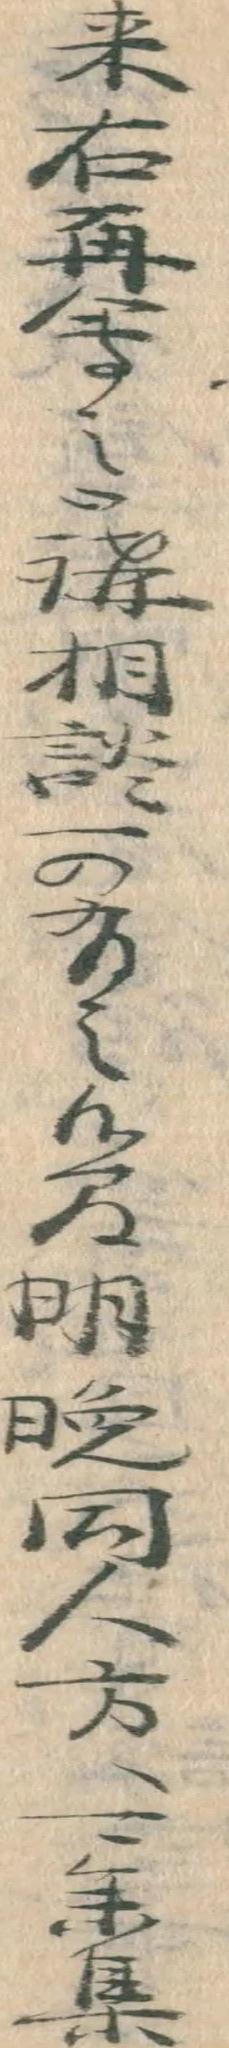来右再会之御講相談可有之候間明晩同人方へ可参集
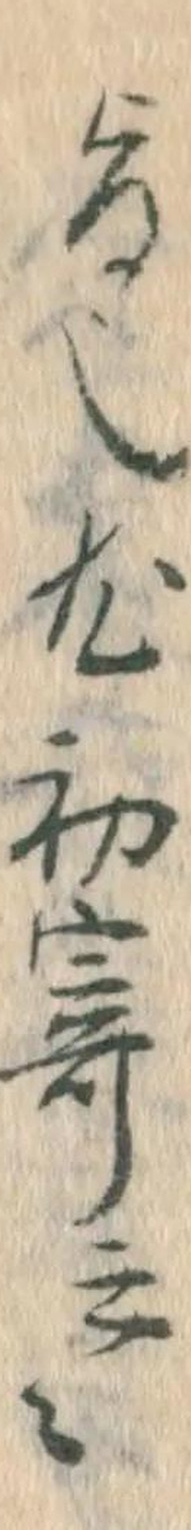旨也尤初寄云々
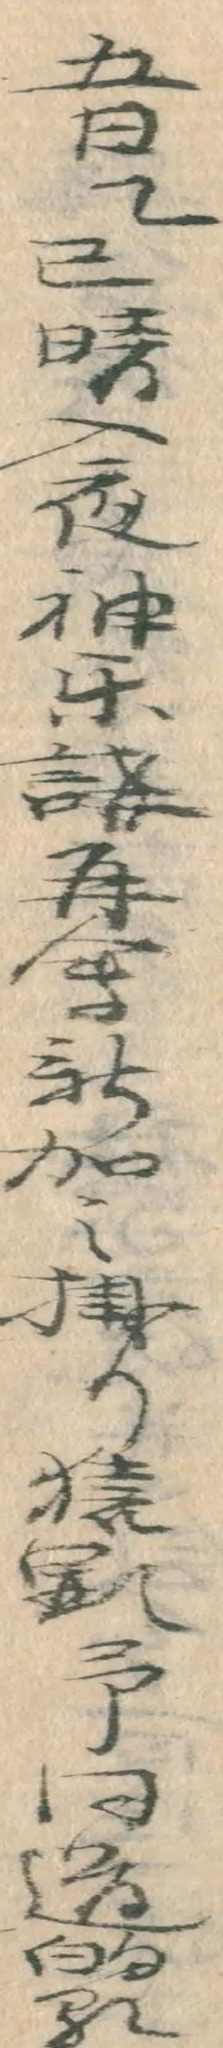五日乙巳晴入夜神楽講再会新加之掛り猿顕予同道的顕
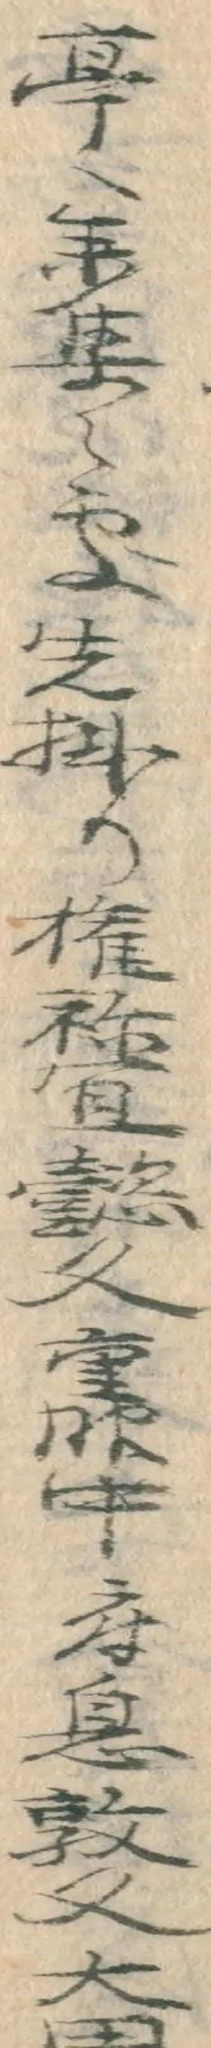亭へ参集之処先掛り権禰宜懿久重服中に付息敦久大田
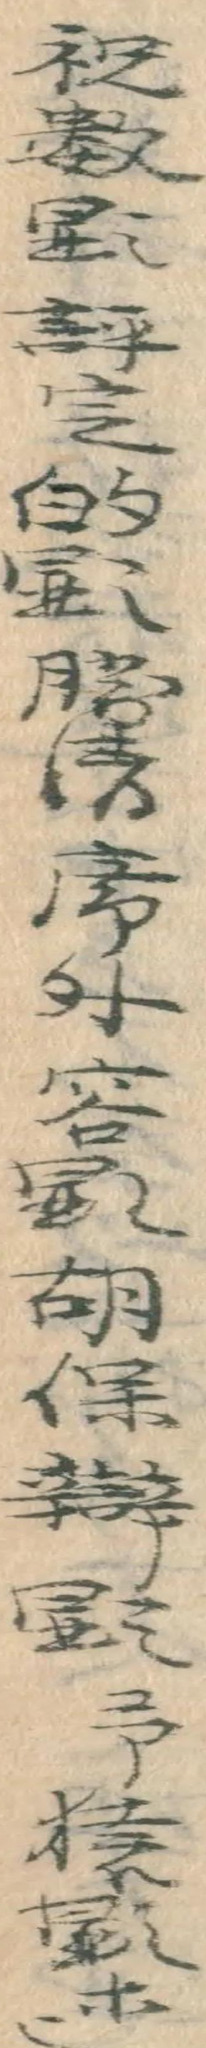祝数顕評定的顕勝清席外容顕胡保弁顕予猿顕等也

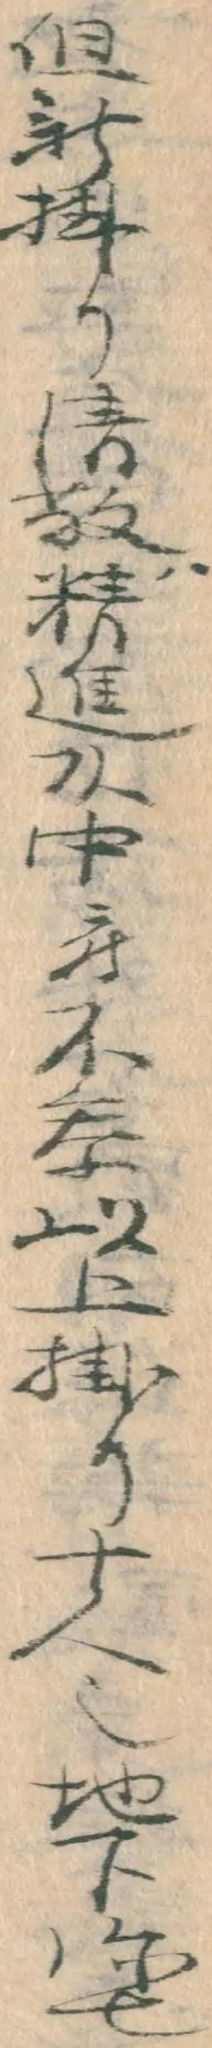但新掛り清敬ハ精進頭中ニ付不参以上掛り十人也地下弥七
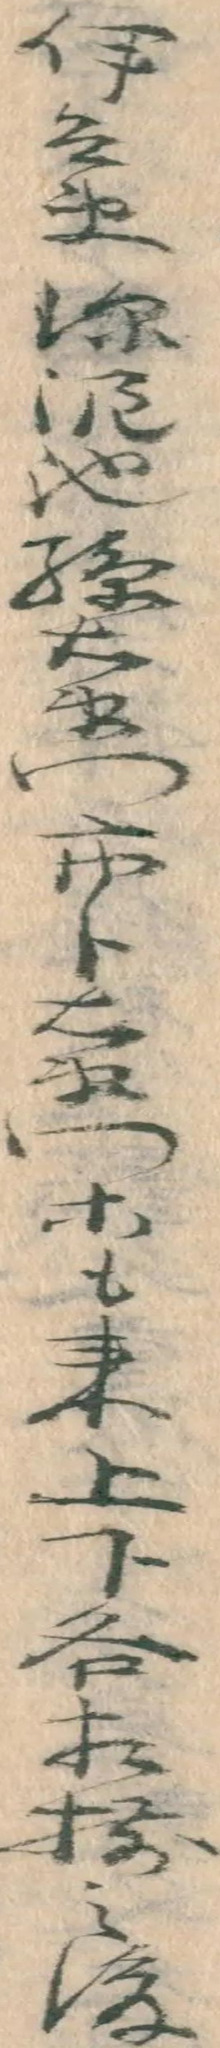伊兵衛深泥池孫右衛門市郎右衛門等も来上下各相揃え後
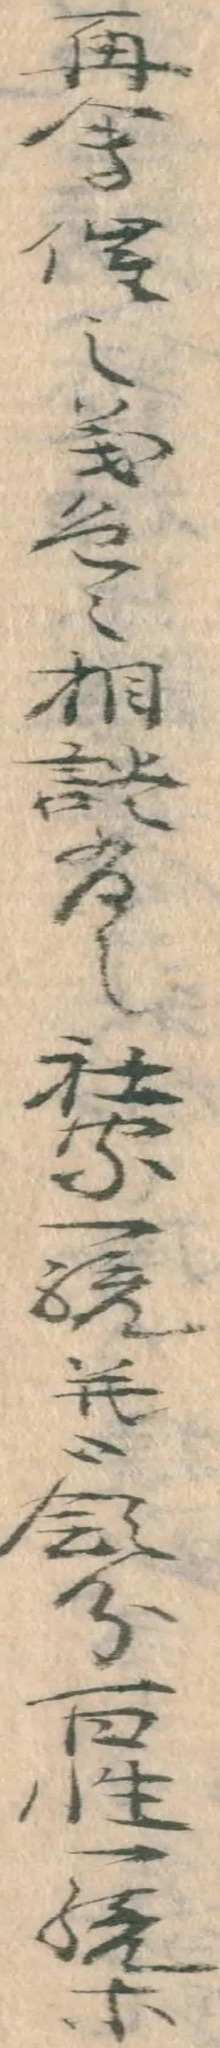再会催之義色々相談有之社家一統幷御領分百性一統等
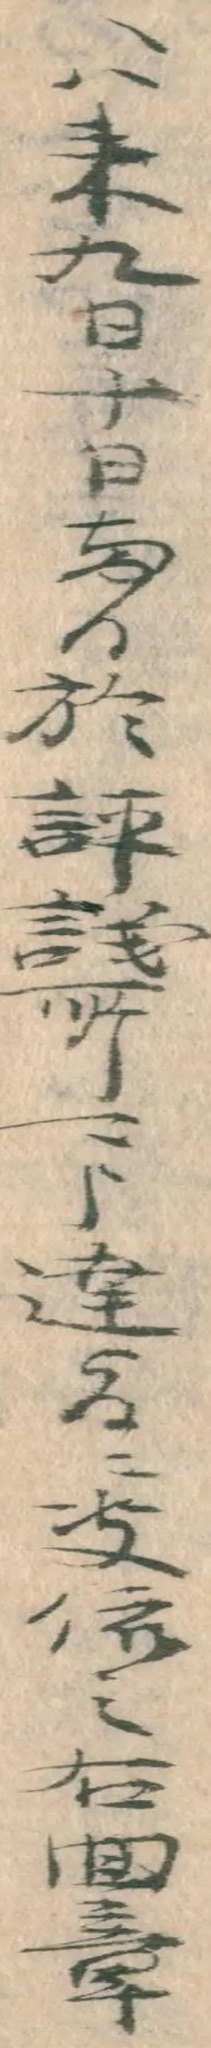へハ来九日十日両日於評議所可申達旨ニ決依之右回章
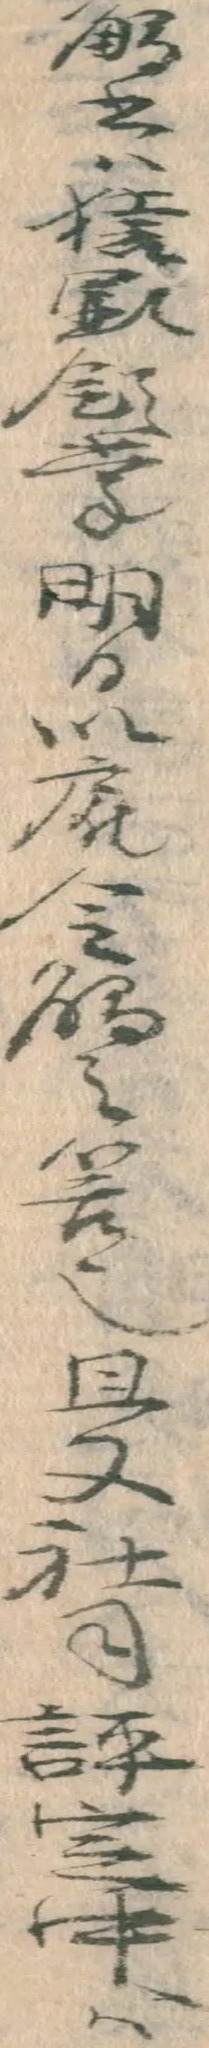触書ハ猿顕領掌明日以雇令触之筈也且又社司評定中へハ
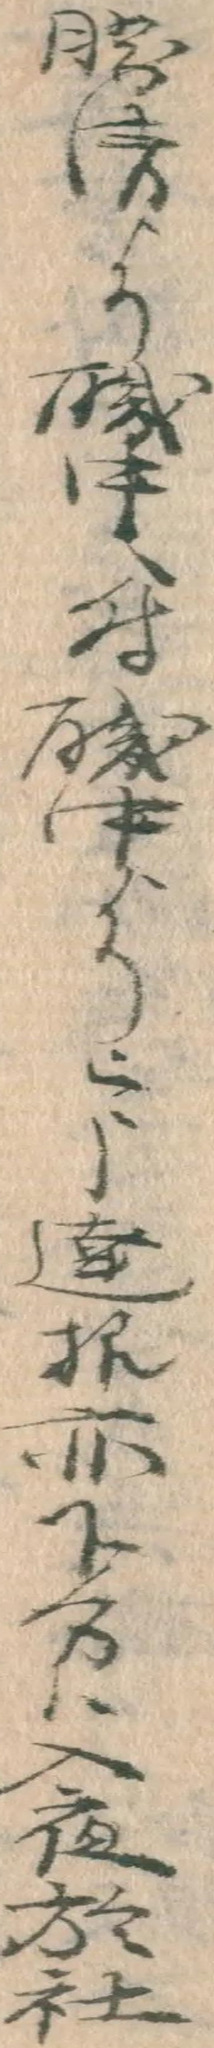勝清より職中へ付職中より被申達様亦下分ハ入夜於社
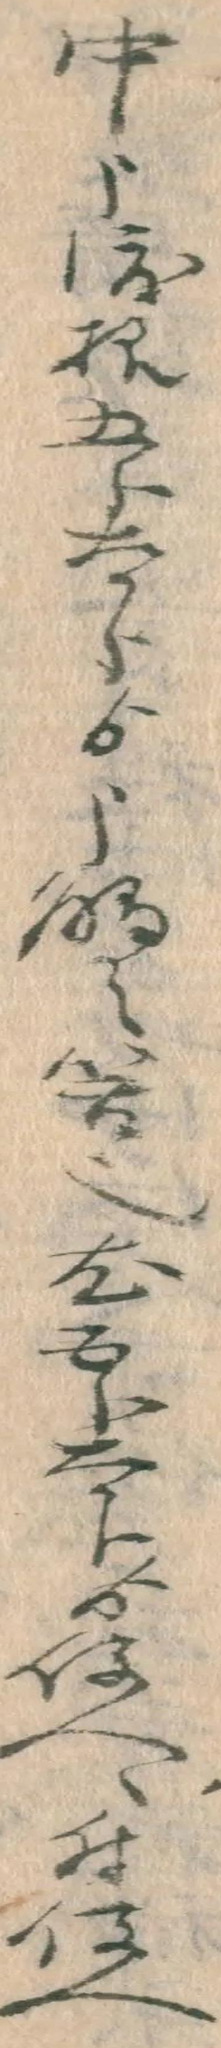中申渡様五郎太郎ゟ申触之筈也尤五郎太郎ゟ役人へ付役人
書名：賀茂社記録. 第64冊
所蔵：国立国会図書館 National Diet Library, JAPAN
